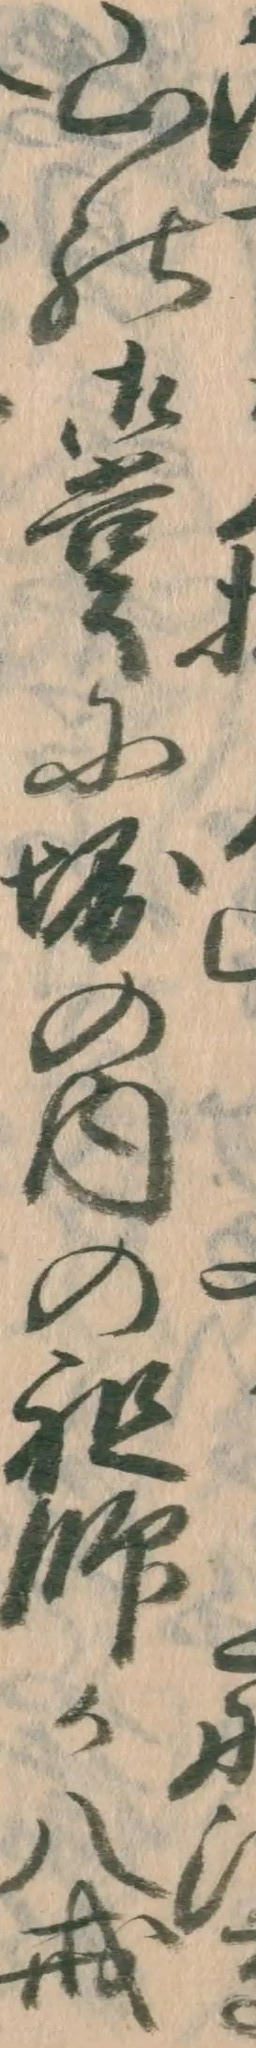山の御堂に堀の内の祖師か八戒
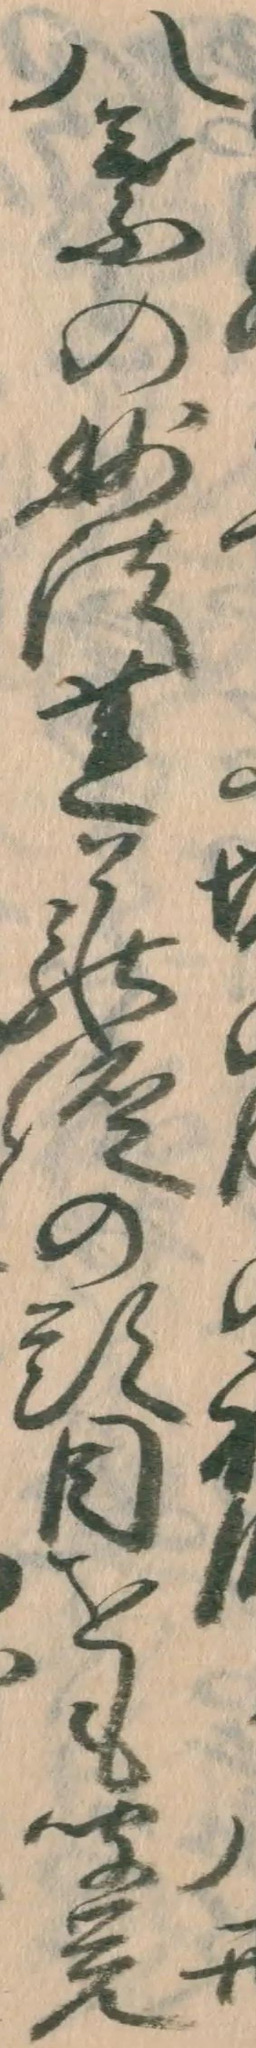八葉の妙法蓮華経の題目をも聞覚
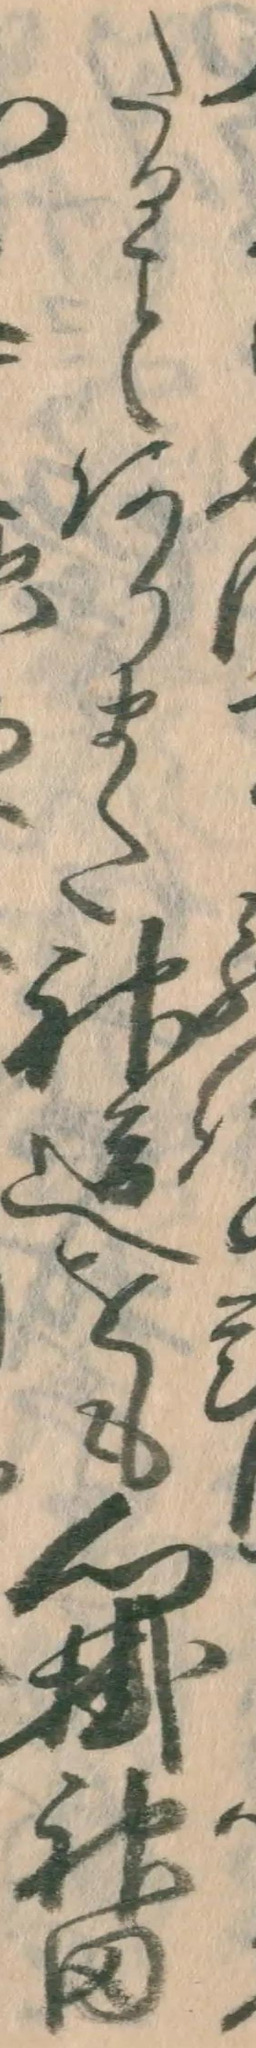たることありまた神道をも心掛神田
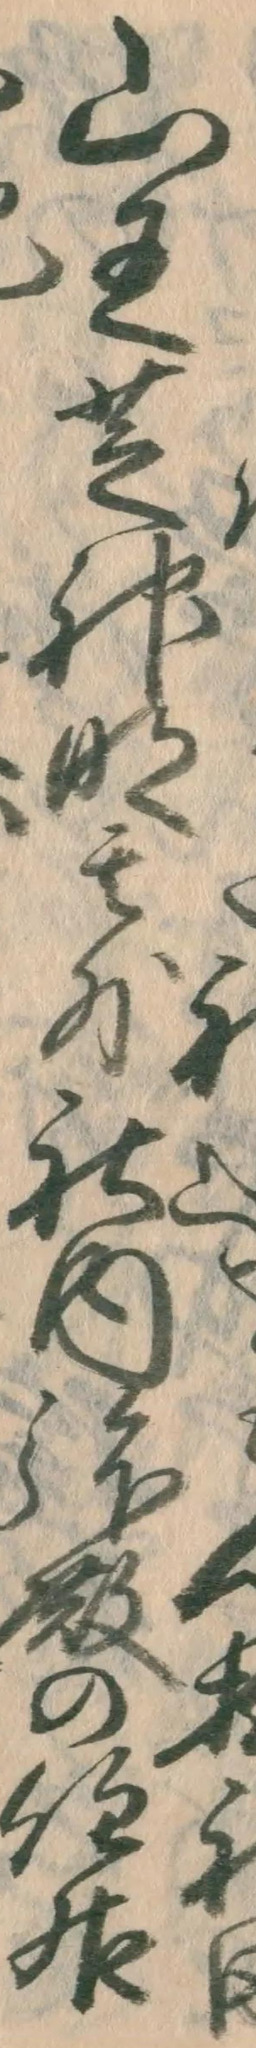山王芝神明其外社内拝殿の住居
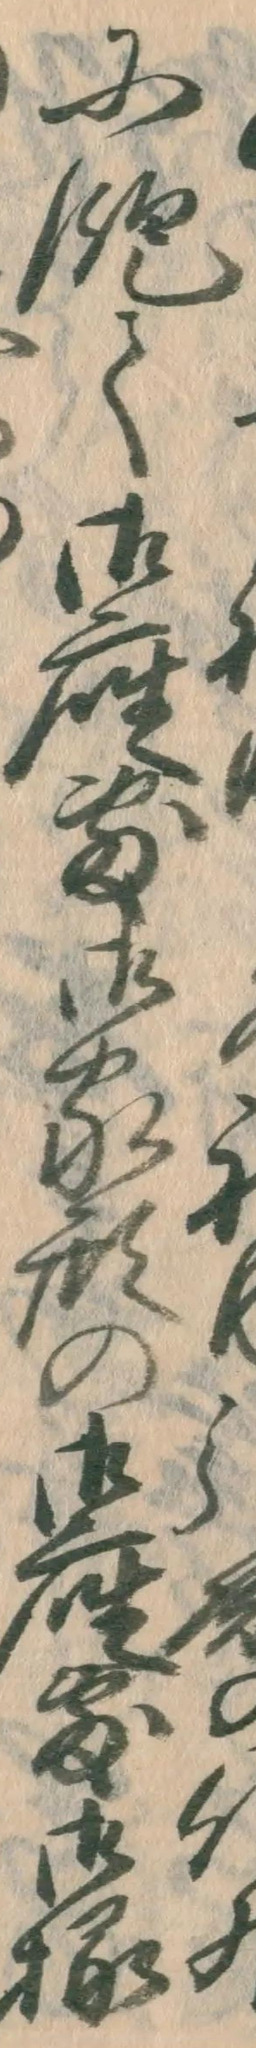に飽て御座敷御家形の御座敷御縁
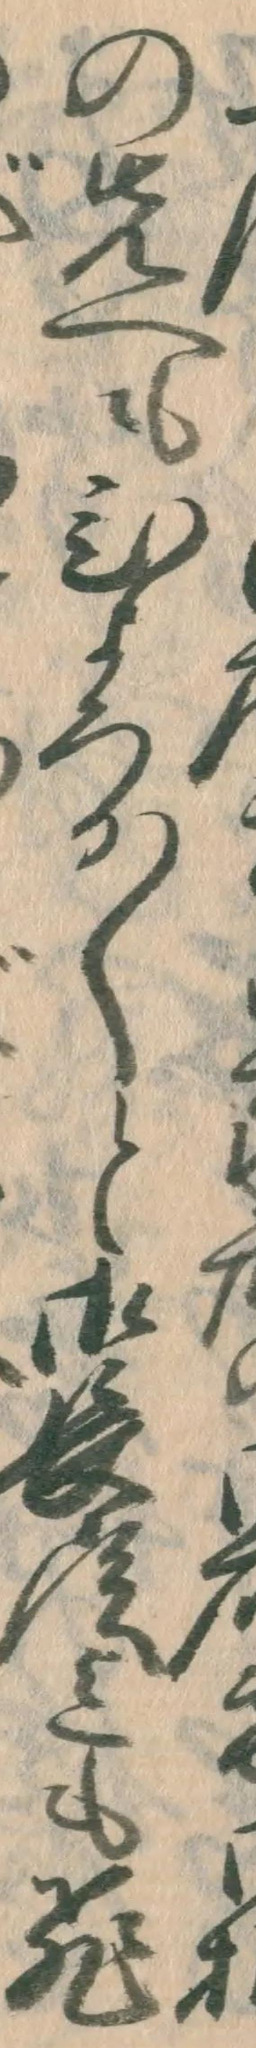の先へもひよろり〳〵と御長屋迄も飛
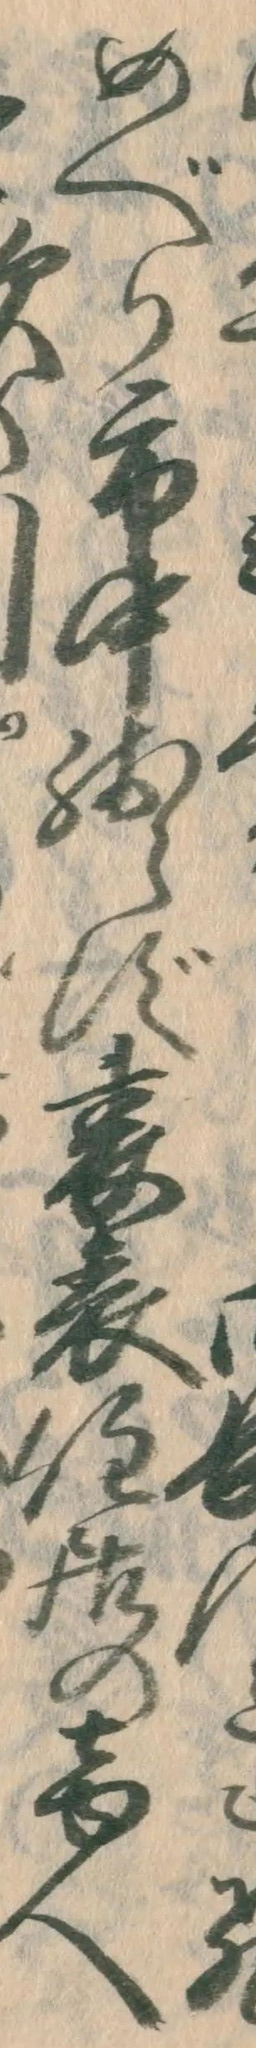めぐり市中残らず裏表住居の商人
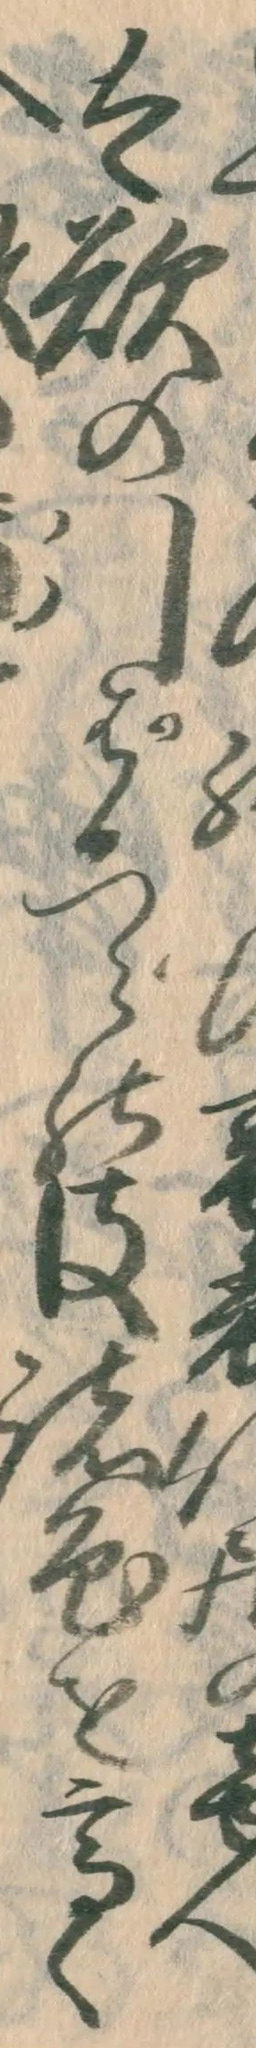は欲の引ぱるつらの皮諸色を高く
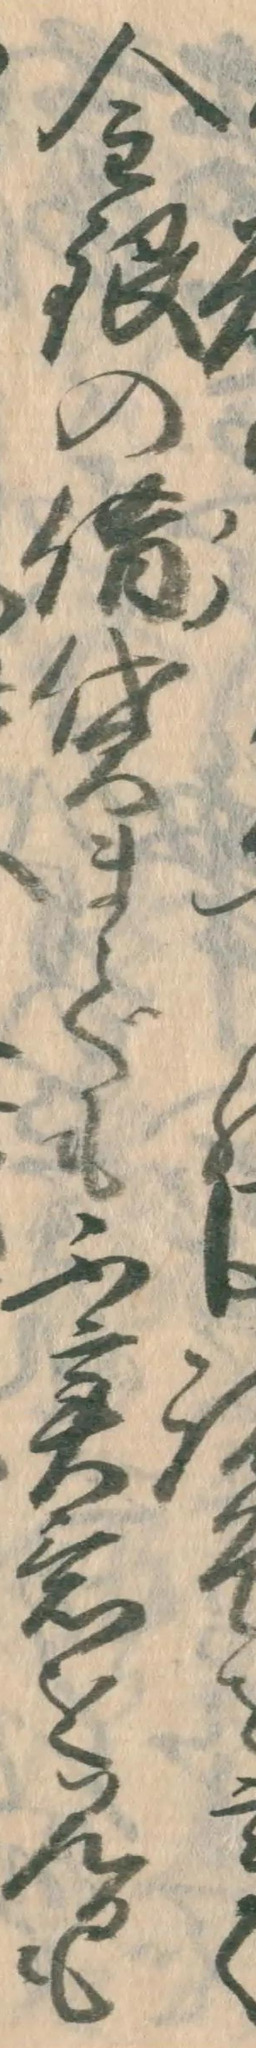金銀の借貸までも不実意を見るも
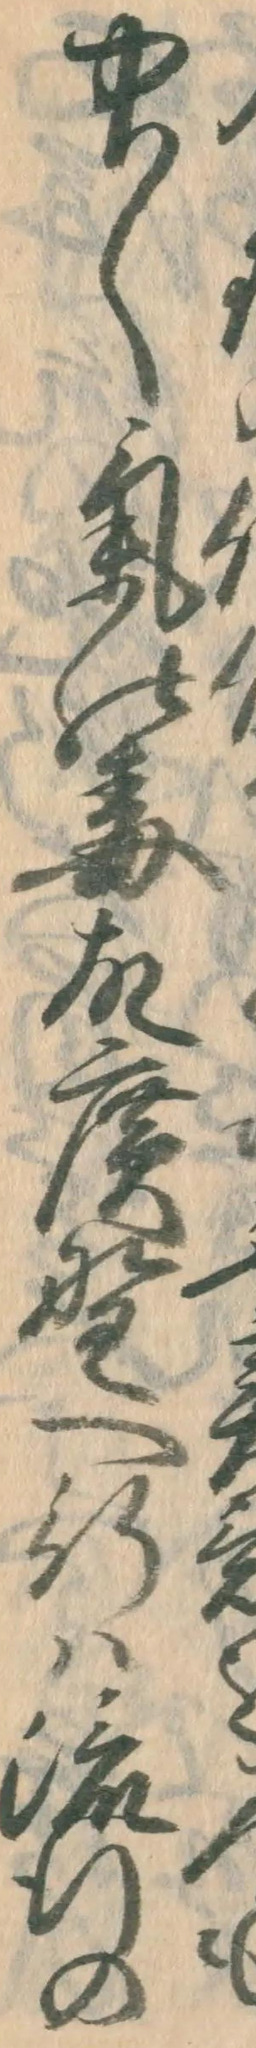中〳〵氣の毒故広野へ行ハ流行の

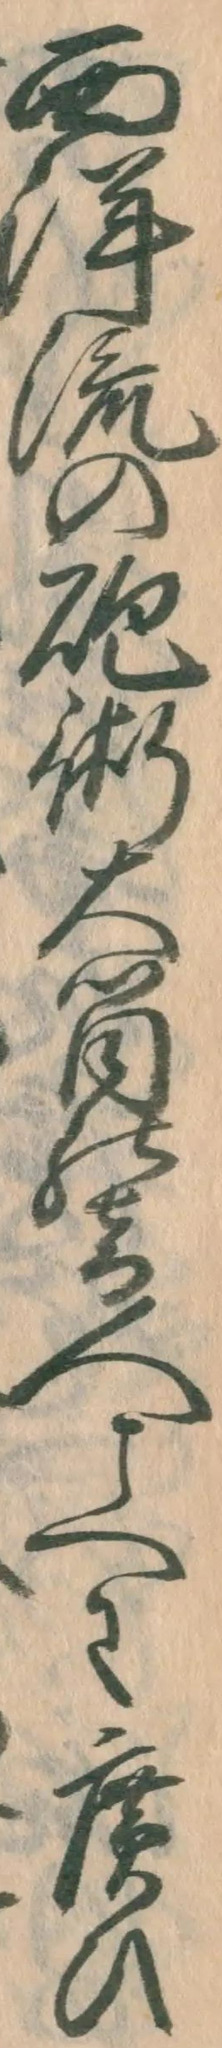西洋流の砲術大筒の音人こへに廣ひ
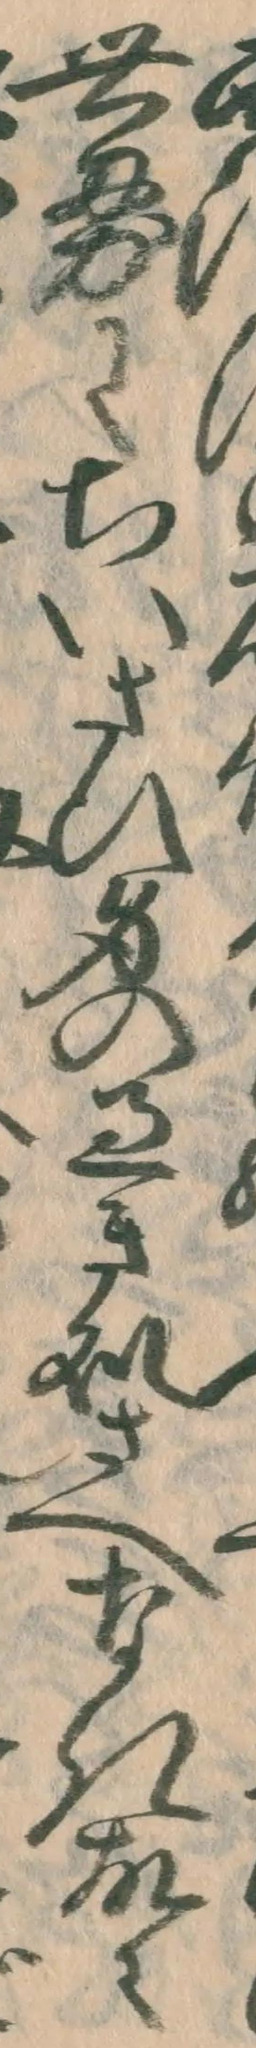世界にちいさひ身の過き処さへなき故に
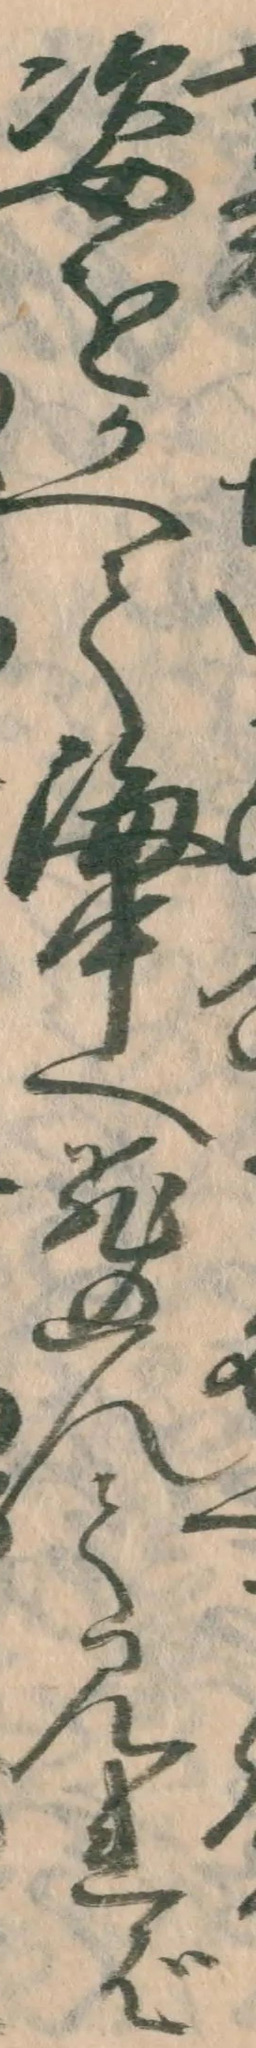姿をかへて海中へ飛込んて見れば
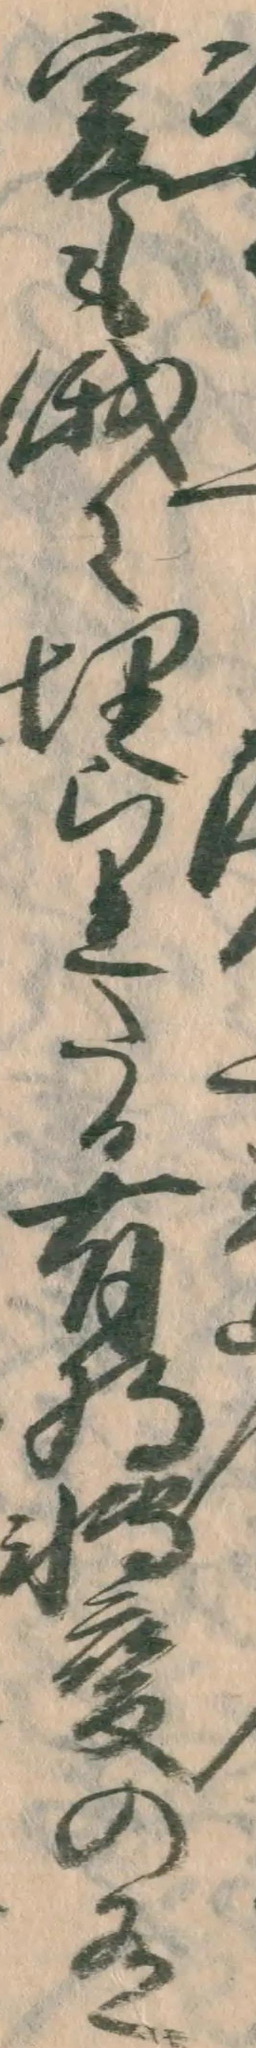爰も俄ニ埋られたる有為転変の有
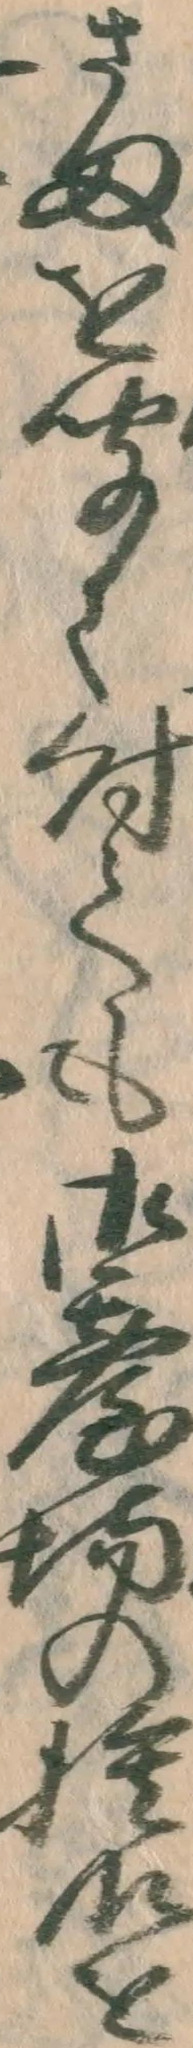さまを聞に付ても御臺場の模様を
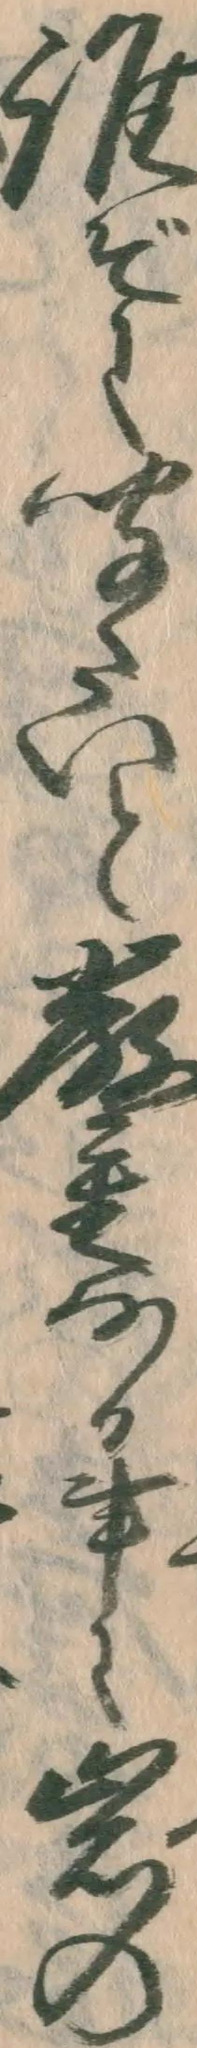誰ぞに聞たいと厳重なる事に岩の
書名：麗斎叢書. 20
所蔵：国立国会図書館 National Diet Library, JAPAN
